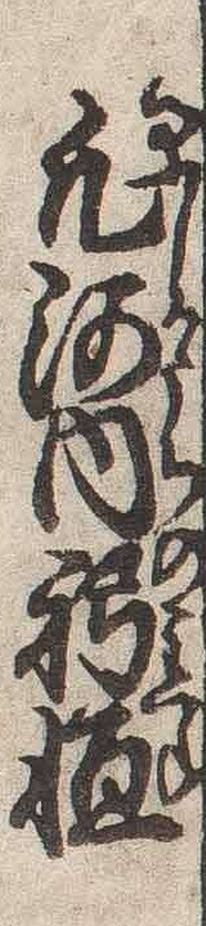凡河内躬恒
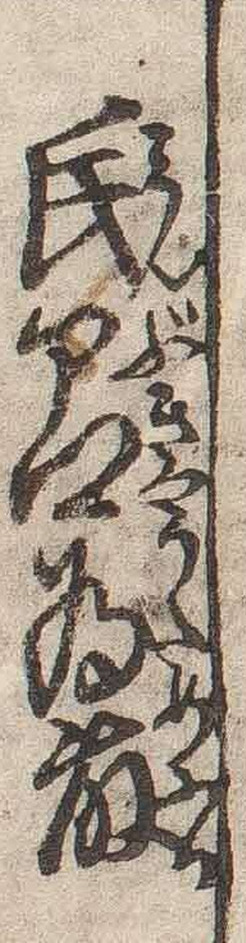民部卿為藤
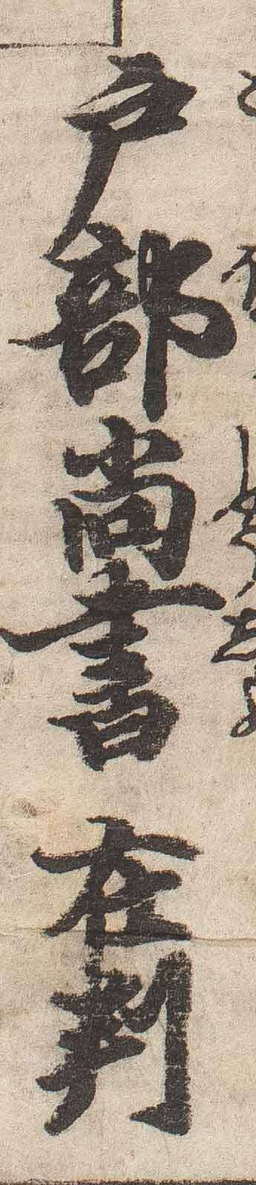戸部尚書在判
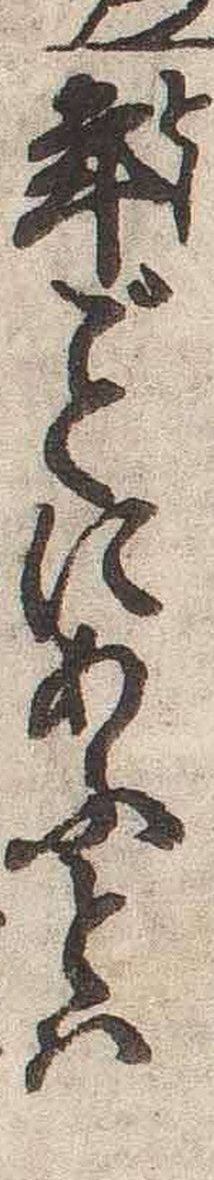年ごとにあふとは
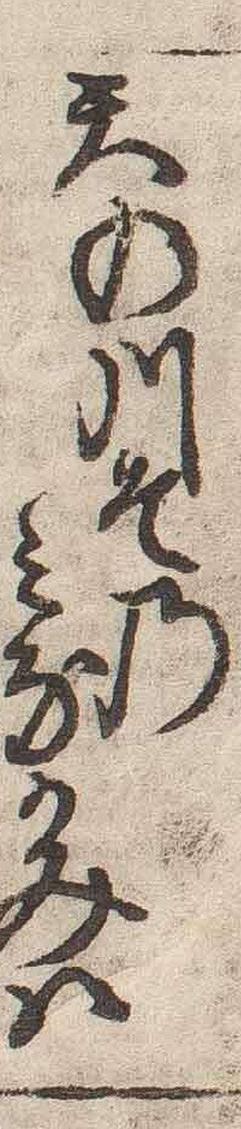天の川その
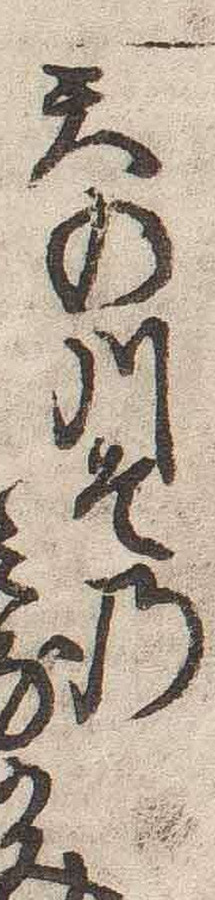天の川その
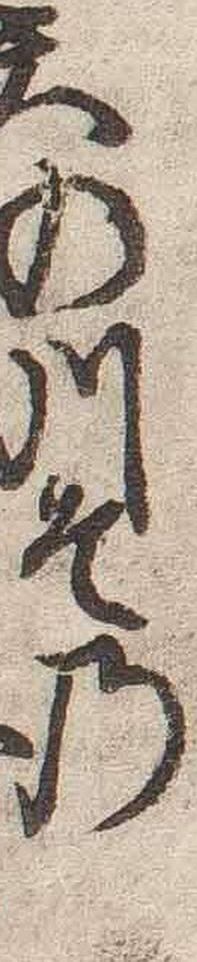天の川その
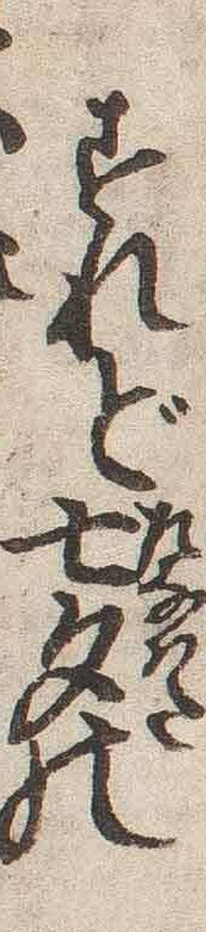すれど七夕の
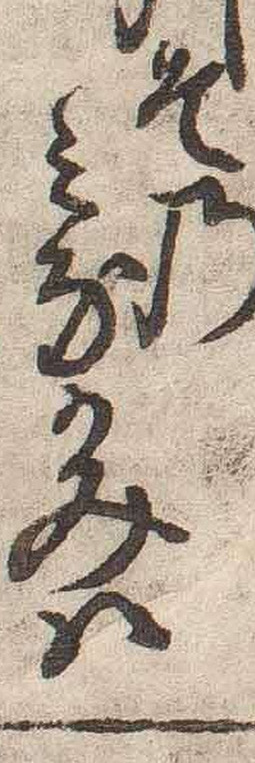みなかみは
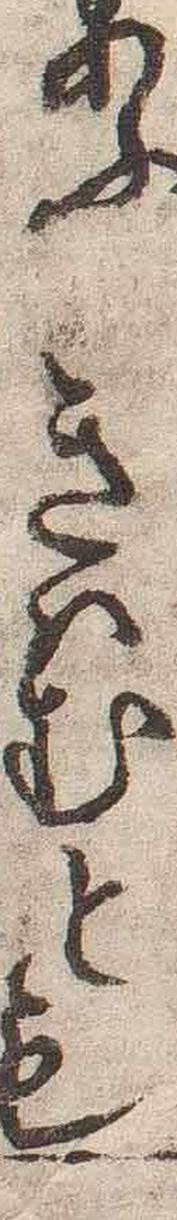あふきはむとも
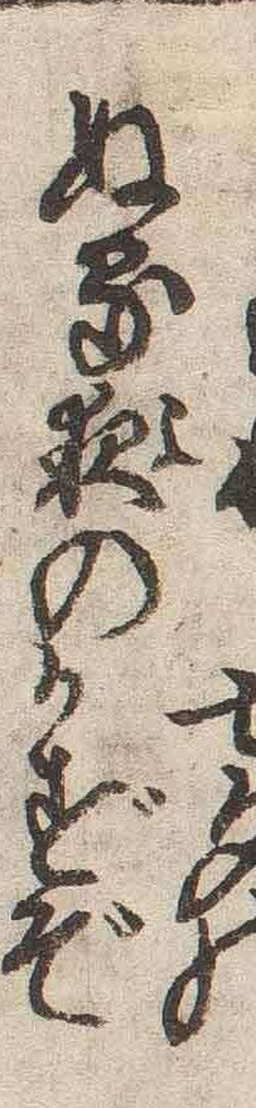ぬる夜のかずぞ
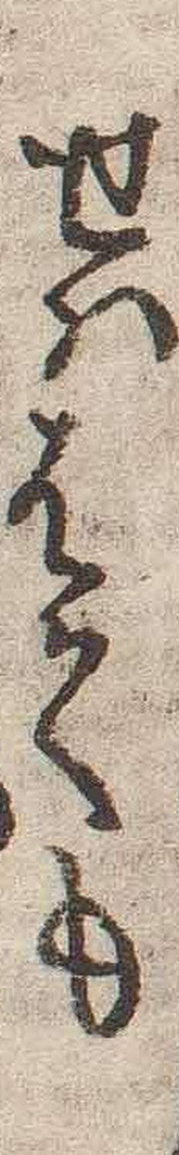せははても
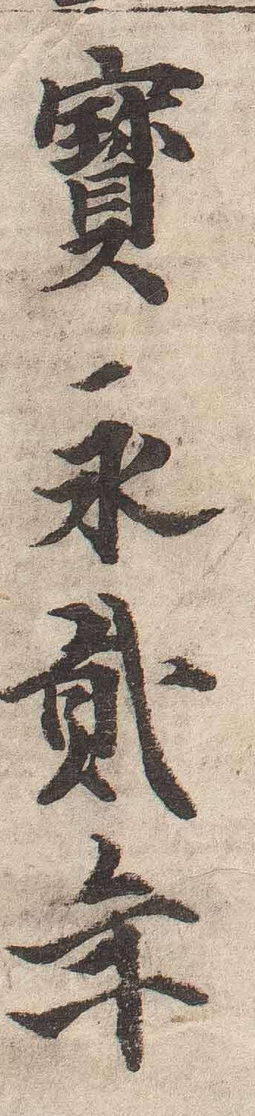宝永弐年
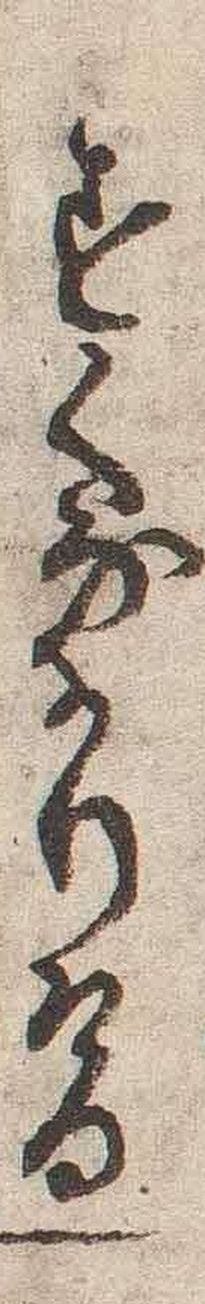すくなかりける
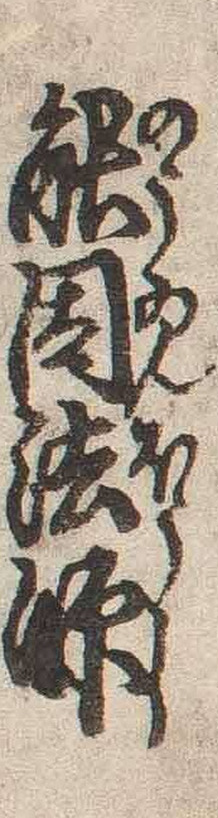能因法師
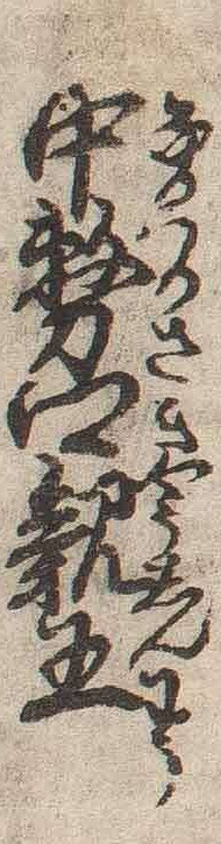中務卿親王
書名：伊勢物語
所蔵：東京学芸大学附属図書館 国文学研究資料館
